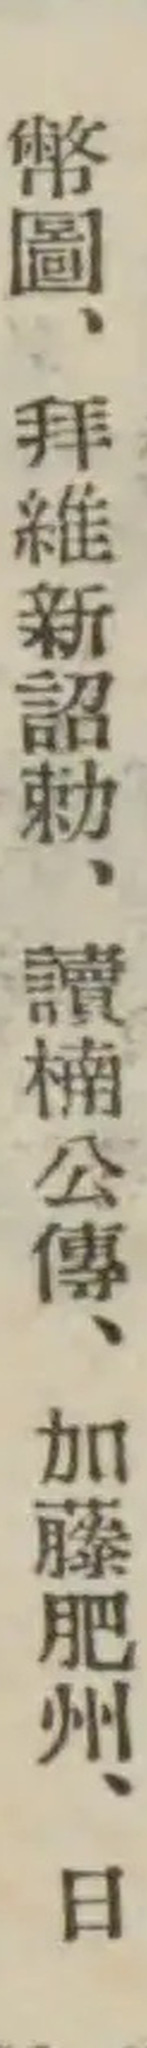幣図、拝維新詔勅、読楠公伝、加藤肥州、日
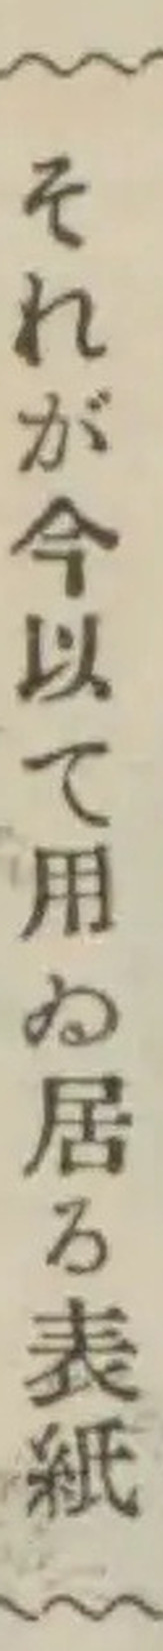それが今以て用ゐ居る表紙
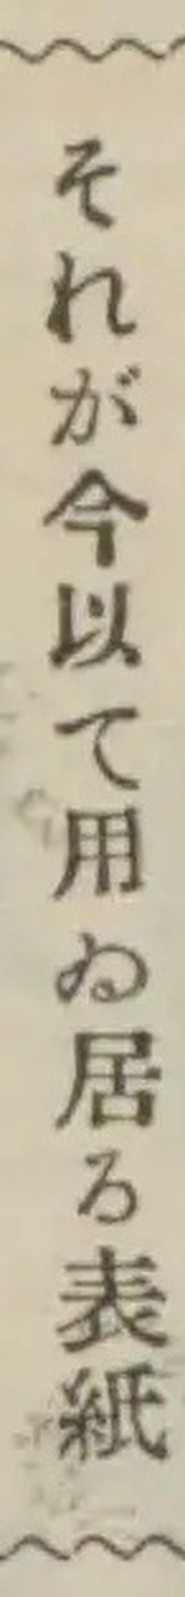それが今以て用ゐ居る表紙
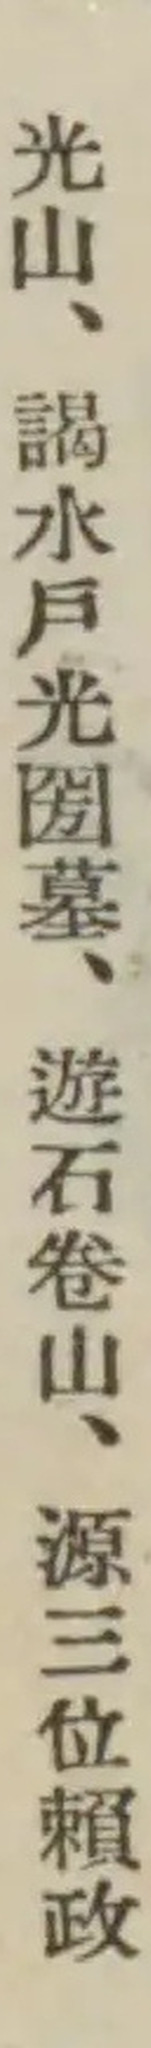光山、謁水戸光圀墓、遊石巻山、源三位頼政
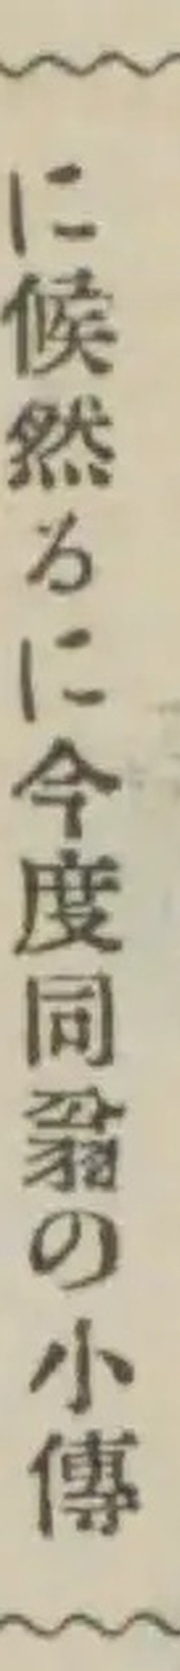に候然るに今度同翁の小伝
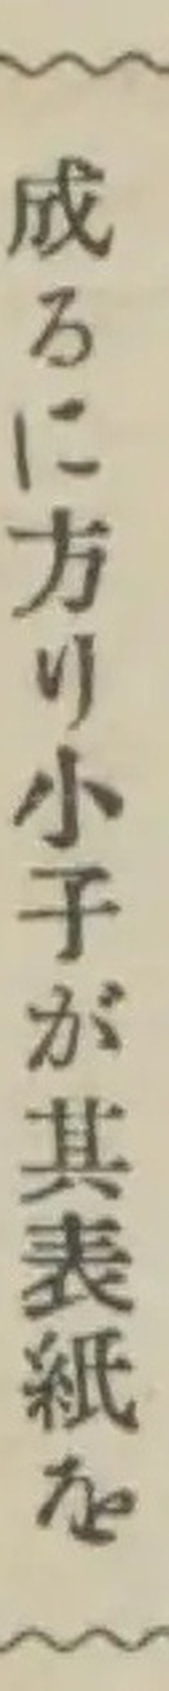成るに方り小子が其表紙を
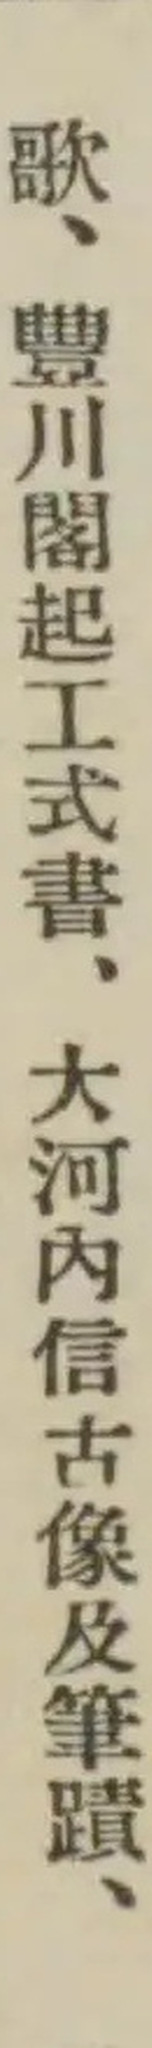歌、豊川閣起工式書、大河内信古像及筆蹟、
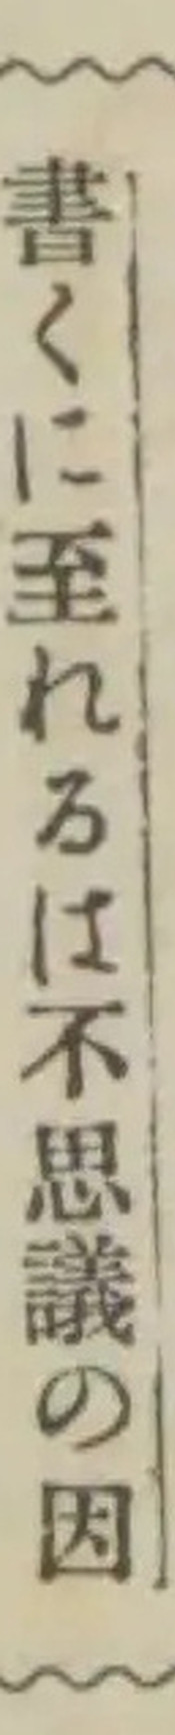書くに至れるは不思議の因
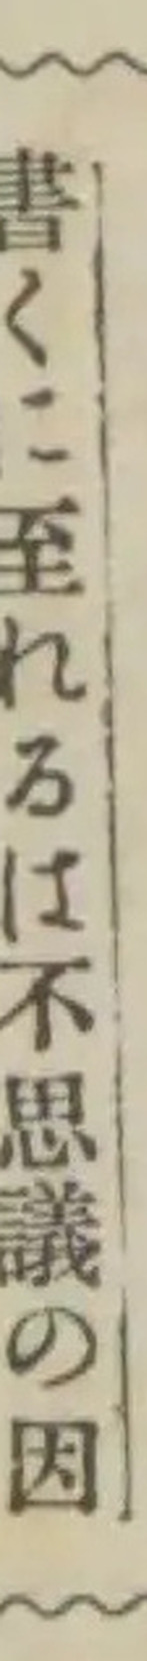書くに至れるは不思議の因
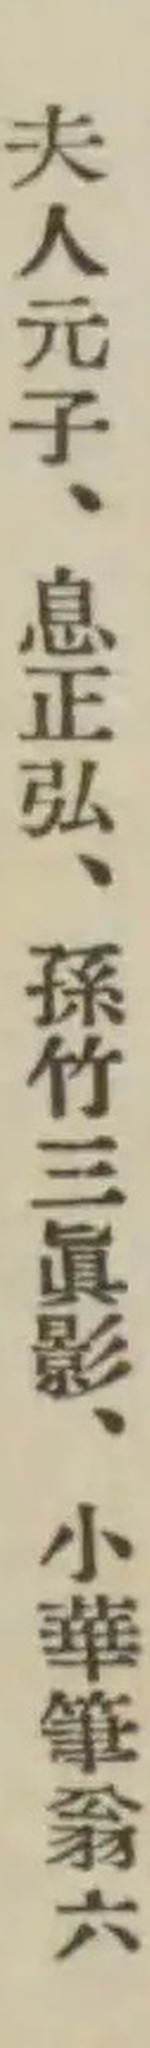夫人元子、息正弘、孫竹三眞影、小華筆翁六
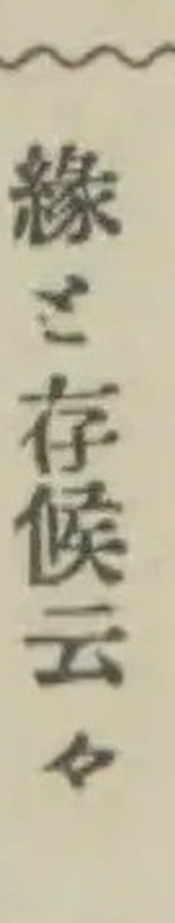縁と存候云々
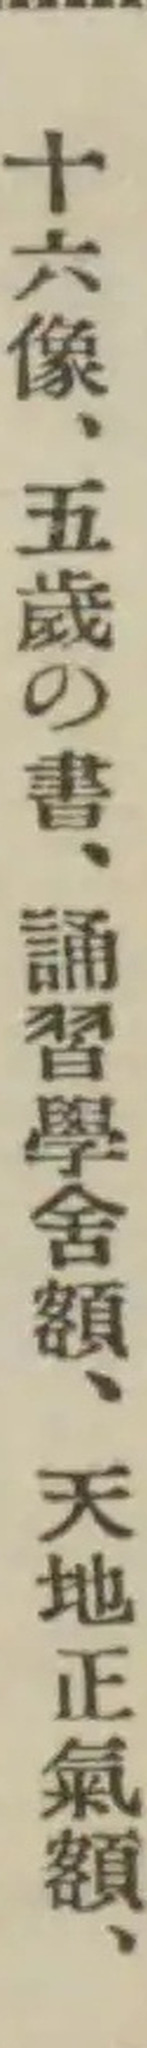十六像、五歳の書、誦習学舎額、天地正気額、
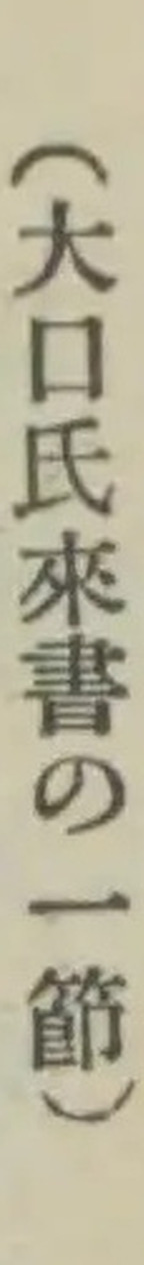(大口氏来書の一節)
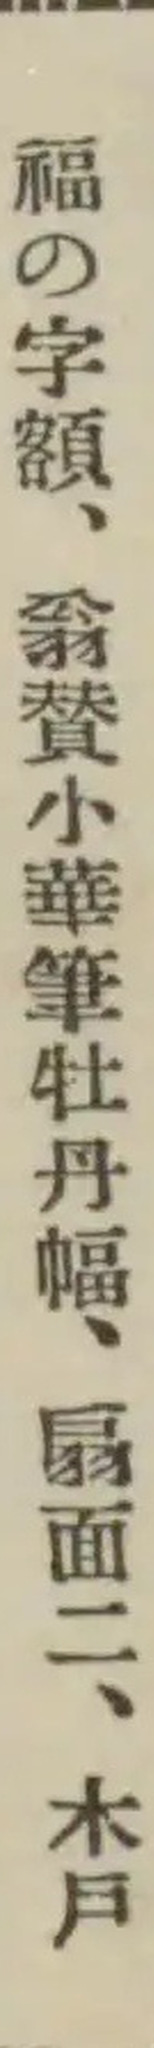福の字額、翁賛小華筆牡丹幅、扇面二、木戸
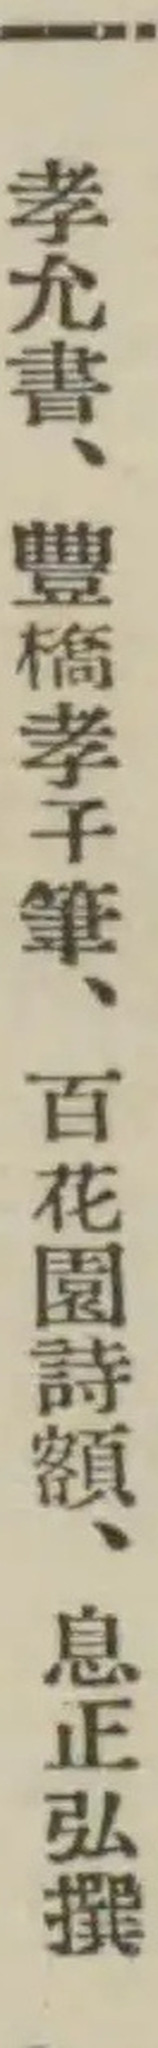孝允書、豊橋孝子筆、百花園詩額、息正弘撰
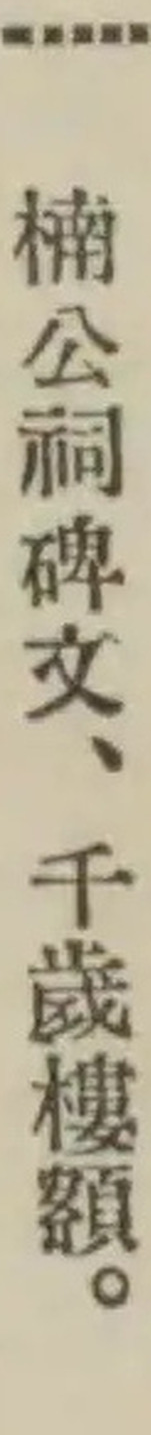楠公祠碑文、千歳樓額。
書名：小野湖山翁小伝
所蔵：国立国会図書館 National Diet Library, JAPAN
